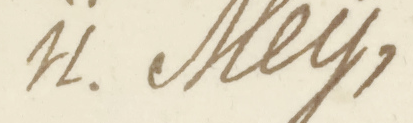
11. Meij,
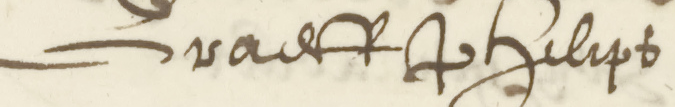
Graeff Philips
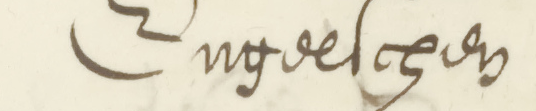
Engelschen
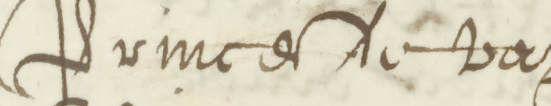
Princesse van
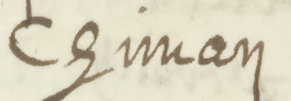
Chimay
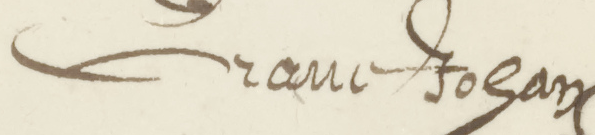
Graue Johan
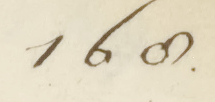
168.
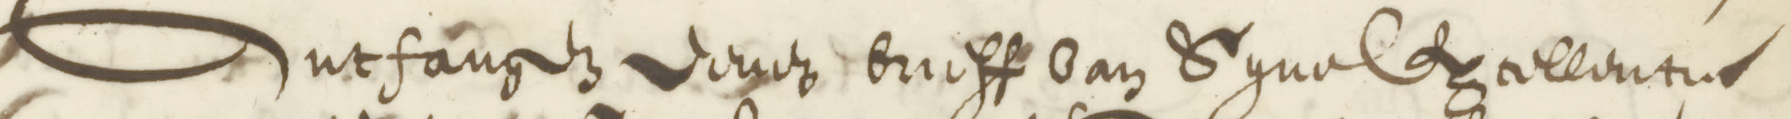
Ontfangen eenen brieff van Syne Excellentie
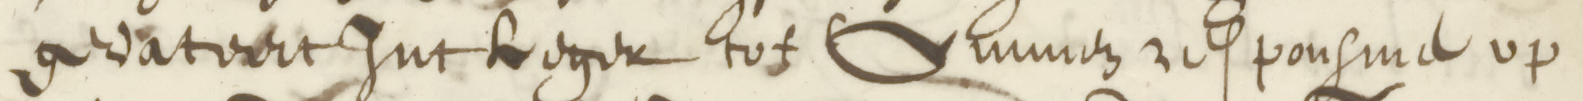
gedateert Int Leger tot Ommen responsiue op
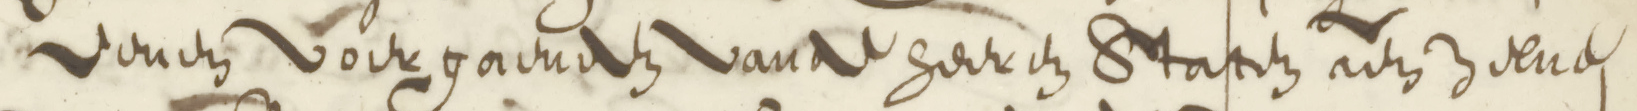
eenen voergaenden vande heeren Staten aen zelue
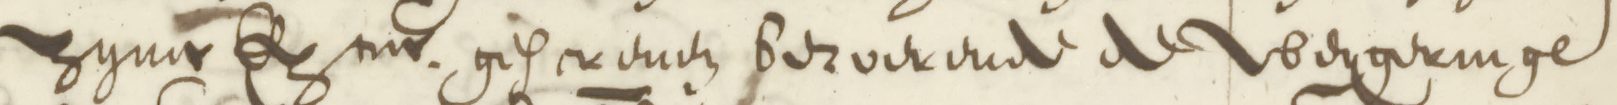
zyner Extie. gescreuen beroerende de weygeringe
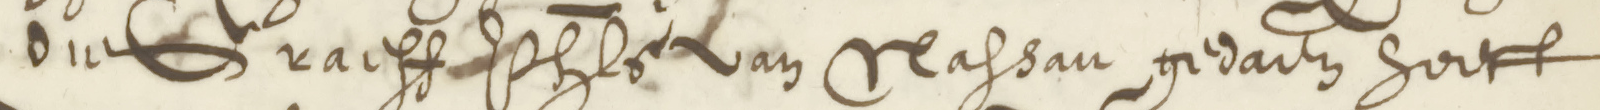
die Graeff Phls van Nassau gedaen heeft
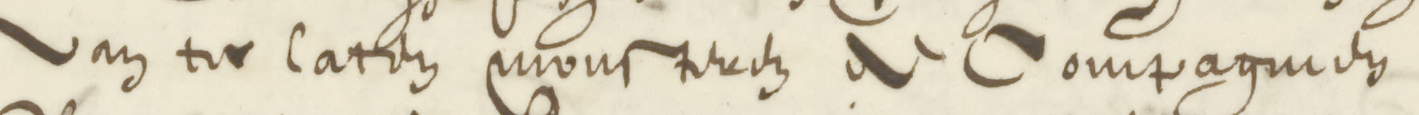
van te laten monsteren de Compagnien
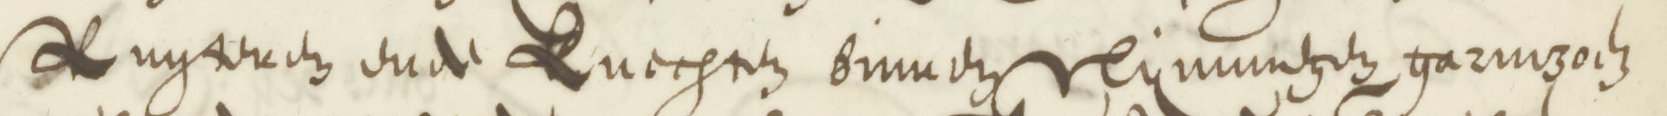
Ruyteren ende Knechten binnen Nijmmegen garnizoen
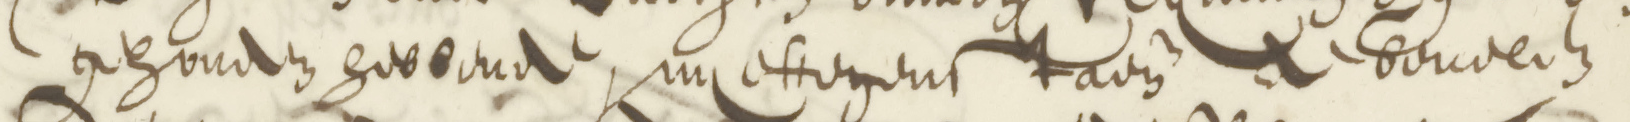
gehouden hebbende, nyettegenstaen de bevelen
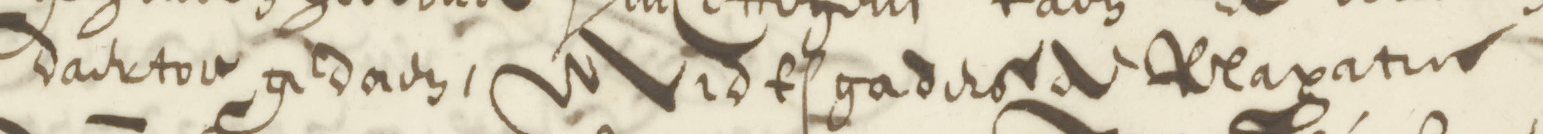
daertoe gedaen, Midtsgaders de Relaxatie
